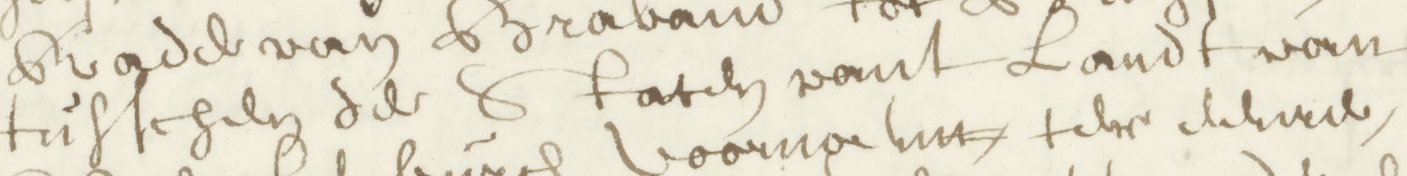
tusschen de Staten vant Landt van
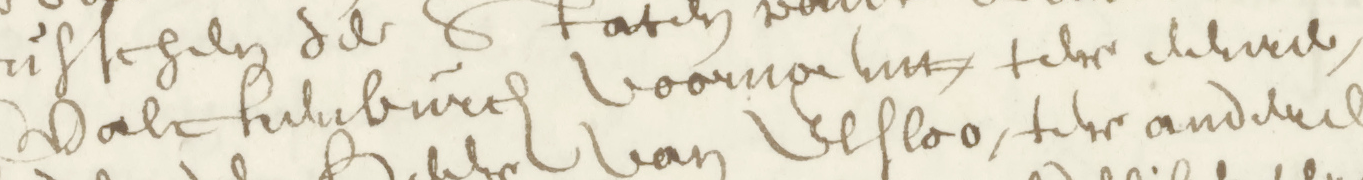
Valckenburch voornoemt, ter eenre,
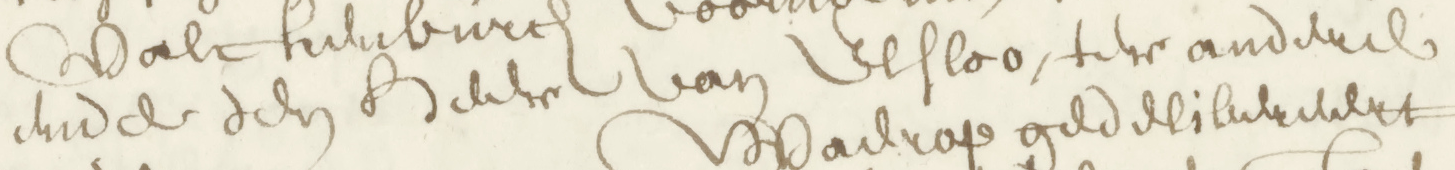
ende den Heer van Elsloo, ter andere
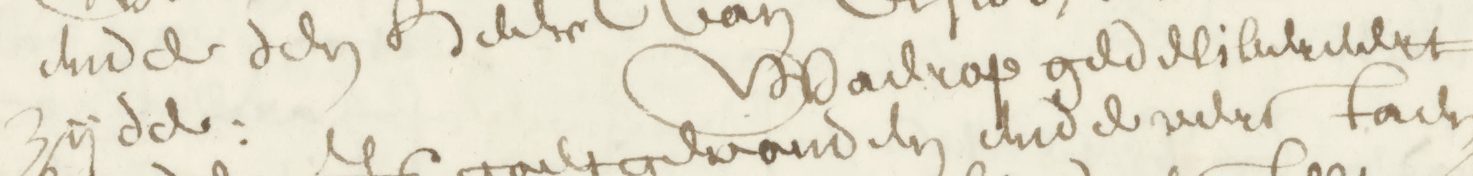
zijde: Waerop gedelibereert
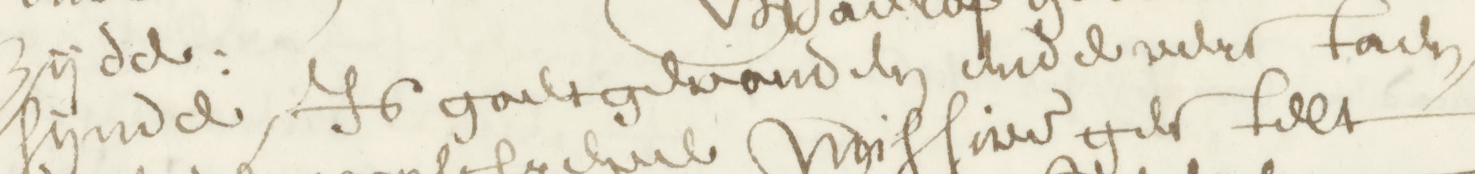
sijnde, Is goetgevonden ende verstaen,
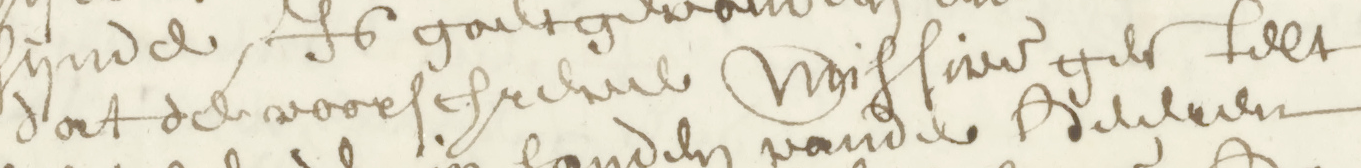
dat de voorschreve Missive gestelt
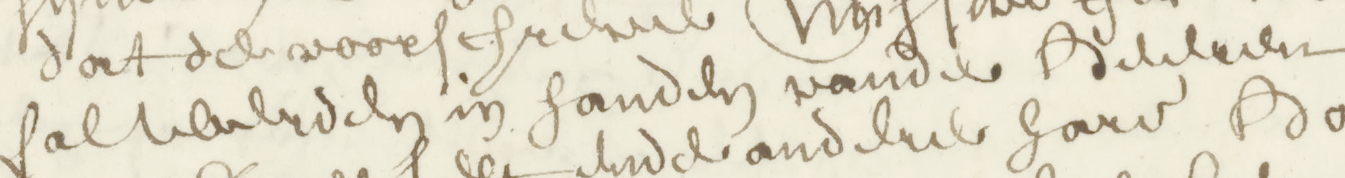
sal werden in handen vande Heeren
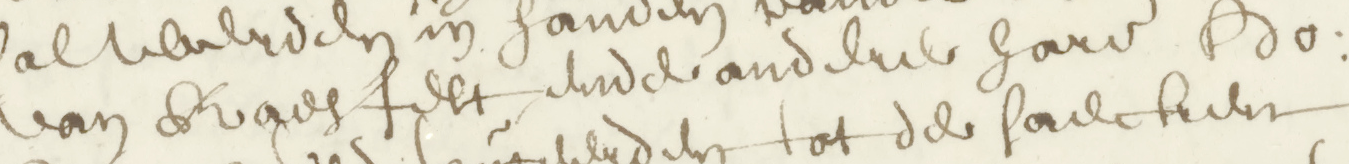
van Raesfelt, ende andere hare Ho:
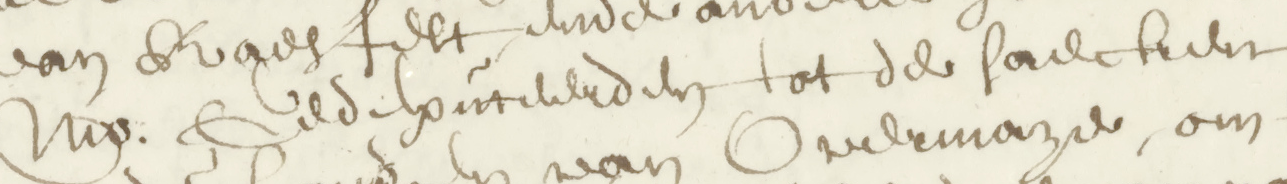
Mo: Gedeputeerden tot de saecken
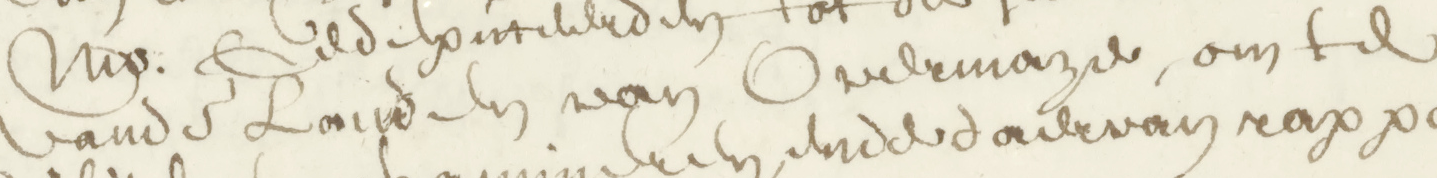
vande Landen van Overmaze, om te
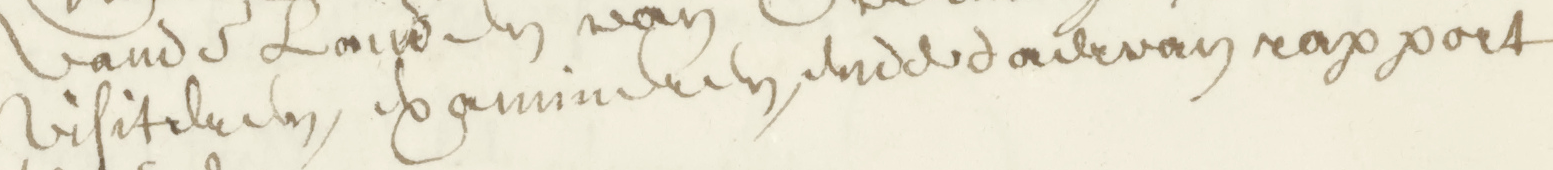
visiteren, examineren, ende daervan rapport
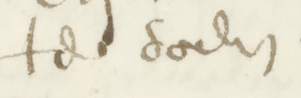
te doen.
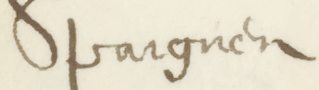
Spaignen
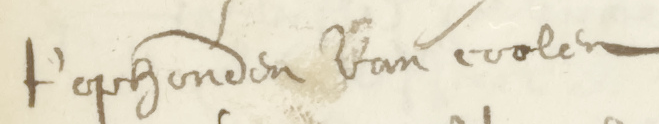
t'ophouden van coolen
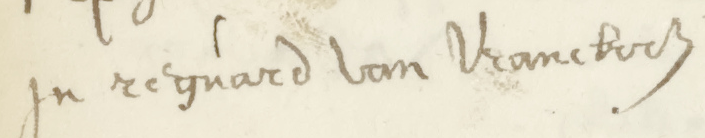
in reguard van Vranckr
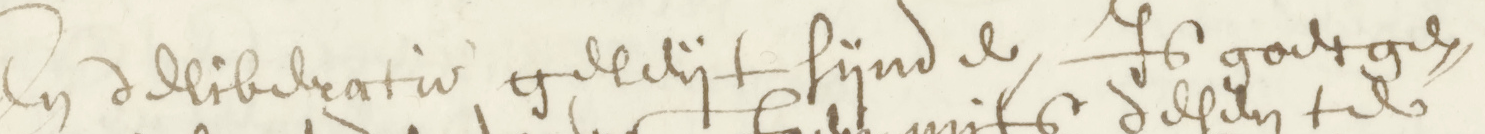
In deliberatie geleijt sijnde, Is goetge„
